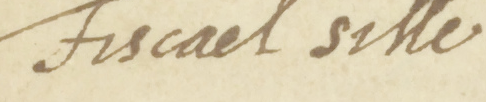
Fiscael sille
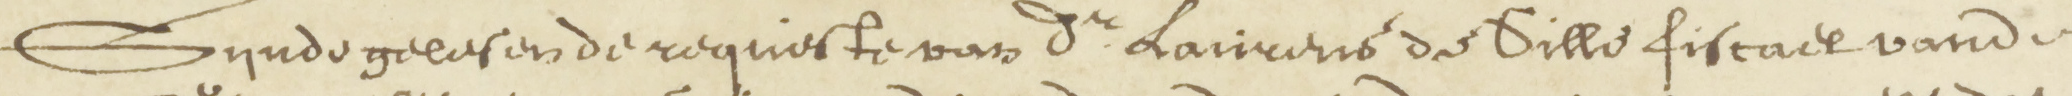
Synde gelesen de requeste van Dr. Laurens de Sille fiscael vande
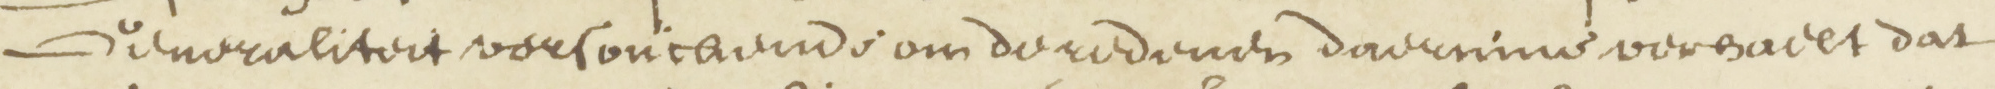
Generaliteit versouckende om de redenen daerinne verhaelt dat
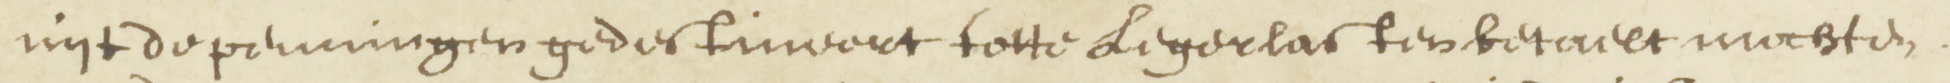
uyt de penningen gedestineert totte Legerlasten betaelt mochten
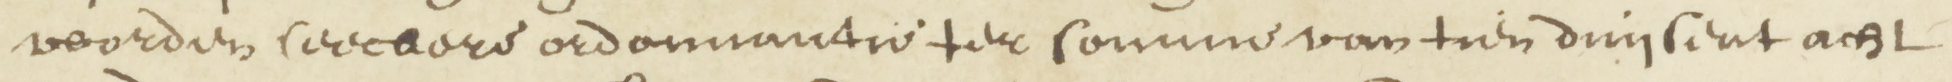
worden seeckere ordonnantie ter somme van tien duysent acht
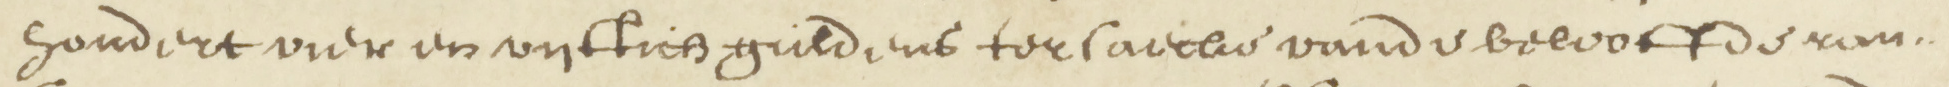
hondert vier en vyftich guldens ter saecke vande belooffde ran„
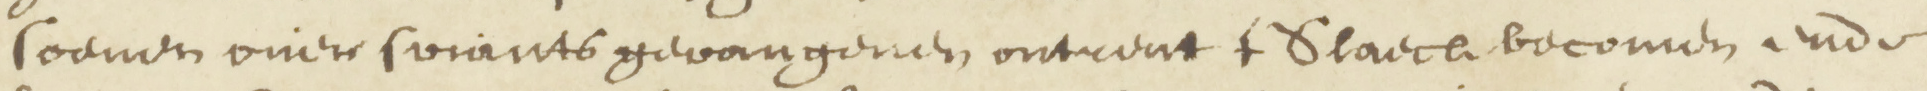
soenen ouer sviants gevangenen, ontrent t‛Slaeck becomen ende
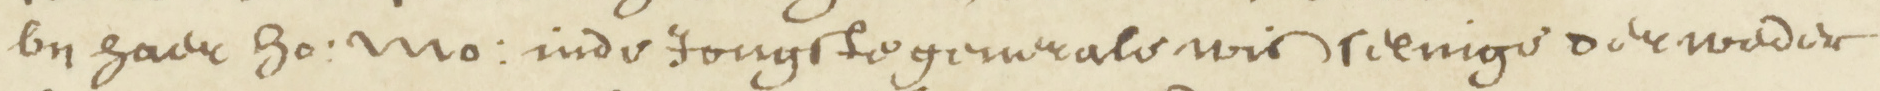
by haer ho:Mo: inde Jongste generale wisselinge der weder
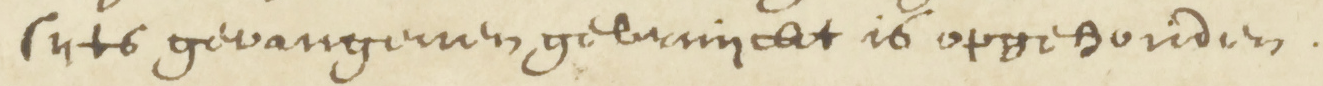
syts gevangenen gebruyckt is opgehouden.
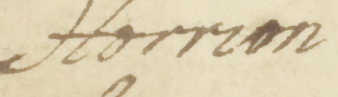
Horrion
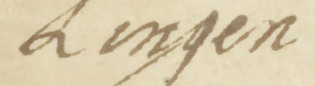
Lingen
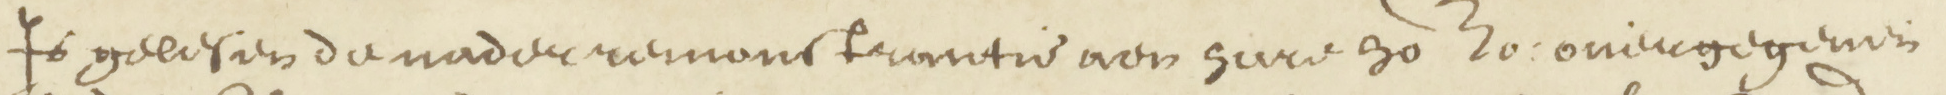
Is gelesen de nader remonstrantie aen hare ho Mo: overgegeven
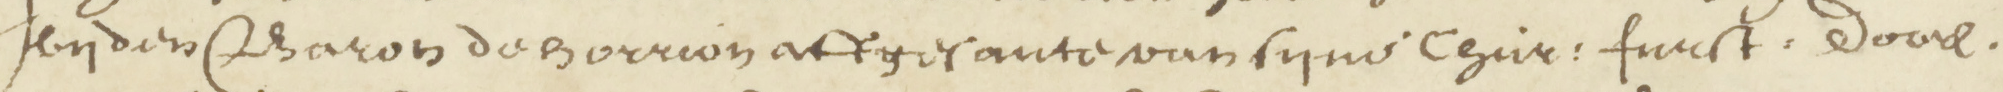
byden Baron de horrion affgesante van syne Chur:furst. Doorl.
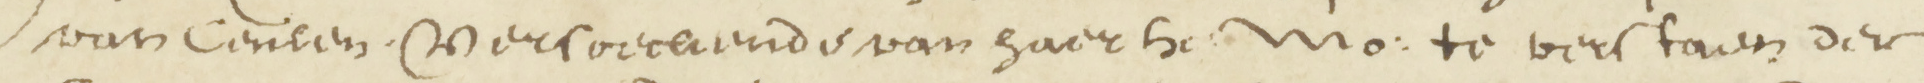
van Ceulen, Versoeckende van haer ho:Mo: te verstaen der
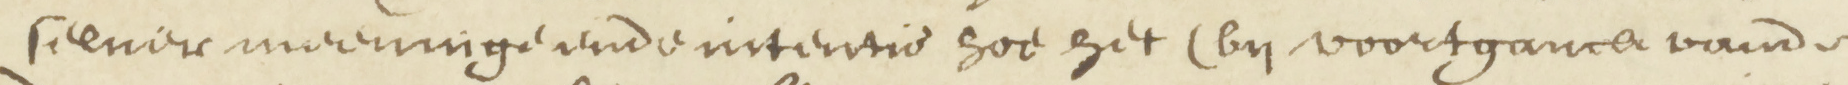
seluer meeninge ende intentie hoe het (by voortganck vande
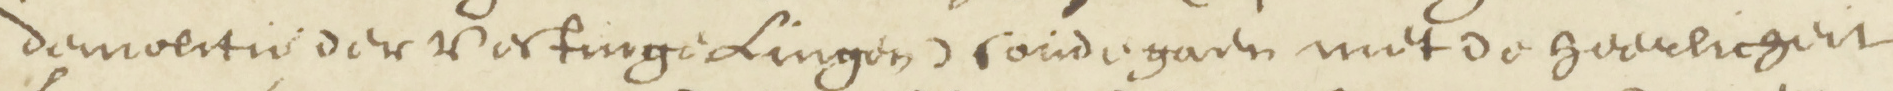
demolitie der Vestinge Lingen) soude gaen met de heerlicheit
